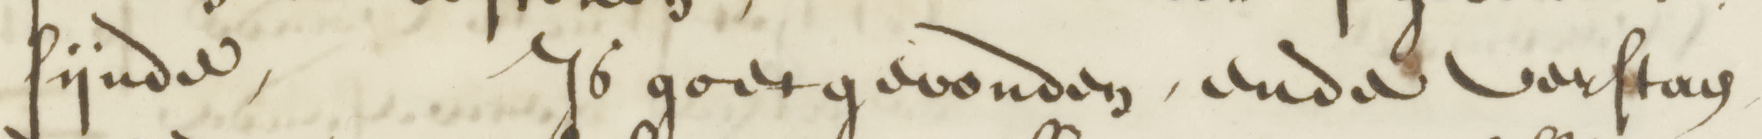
sijnde, Is goet gevonden, ende verstaen
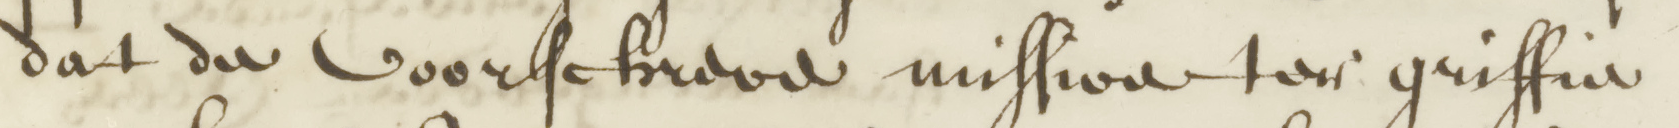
dat de voorschreve missive ter griffie
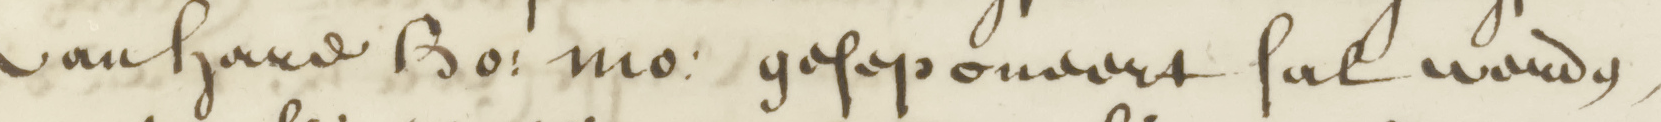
van hare Ho: Mo: geseponeert sal werden
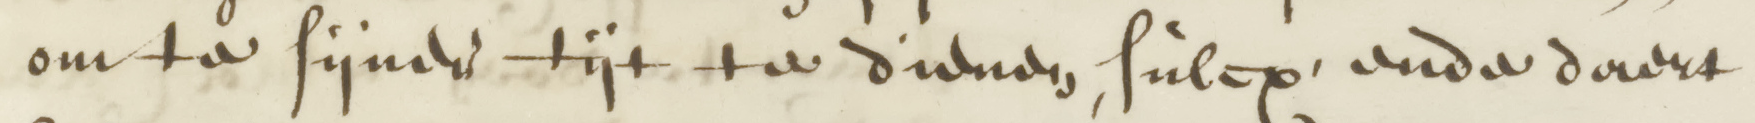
om te sijner tijt te dienen, sulcx, ende daert
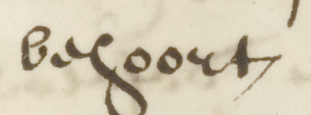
behoort.
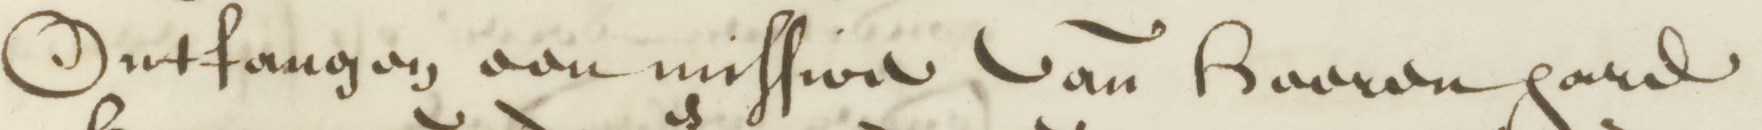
Ontfangen een missive van heeren hare
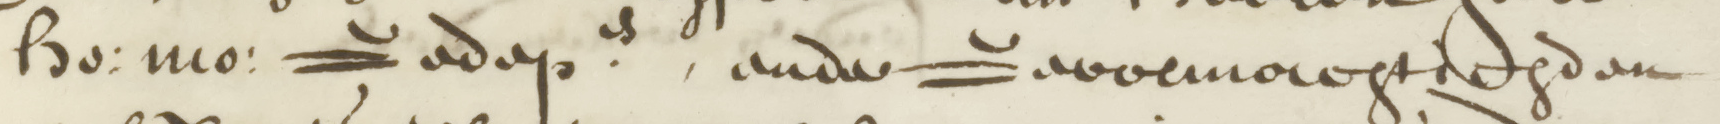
Ho: Mo: Gedepen ende Gevolmachtichden
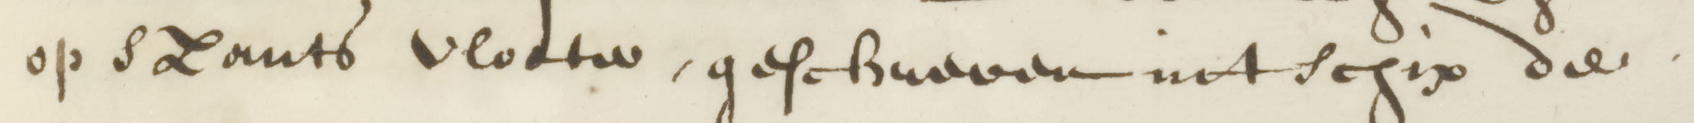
op sLants vloote, geschreven int schip de
